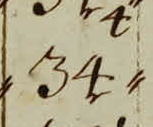34
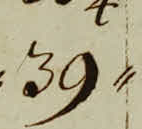39
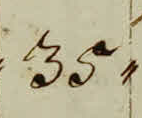35
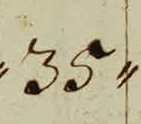35
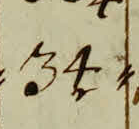34
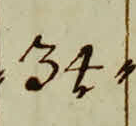34
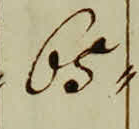65
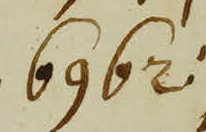6962
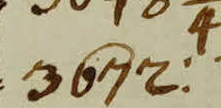3672:
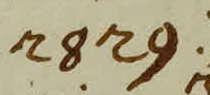2829
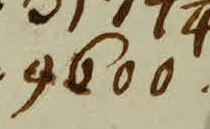9600
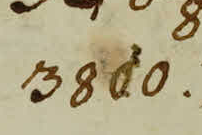3800
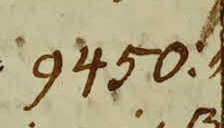9450:
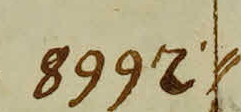8992
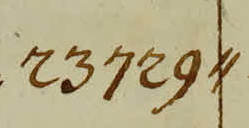23729
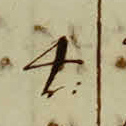4:
